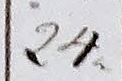24
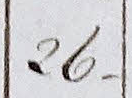26
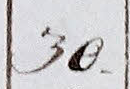30
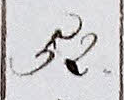52
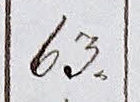63.
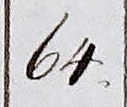64
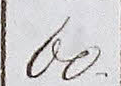60
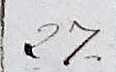27
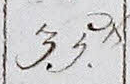35.
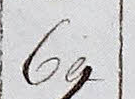69
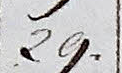29
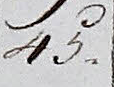45
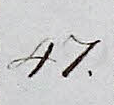47
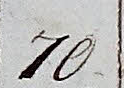70
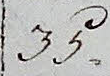35
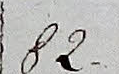82
